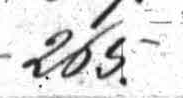265.
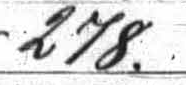278.
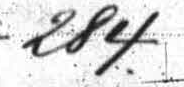284.
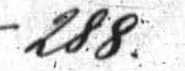288.
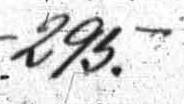295.
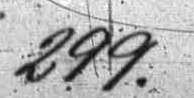299.
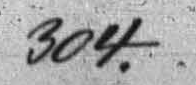304.
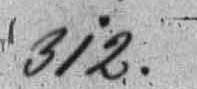312.
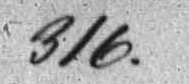316.
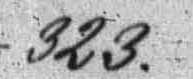323.
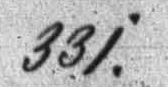331.
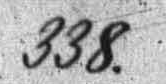338.
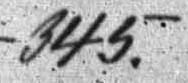345.
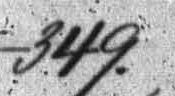349.
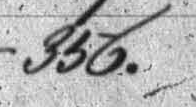356.
